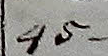45
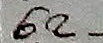62
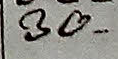30
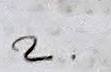2.
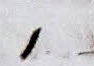1.
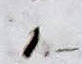1.
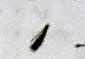1
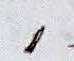1
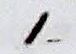1
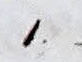1.
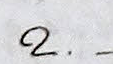2.
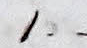1.
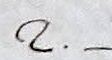2.
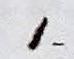1
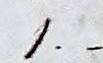1.
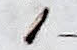1
